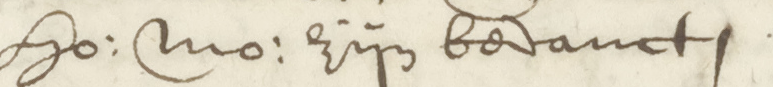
Ho:Mo: zijn bedanckt.
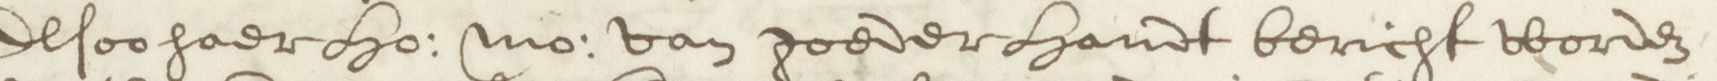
Alsoo haer Ho:Mo: van goederhandt bericht worden
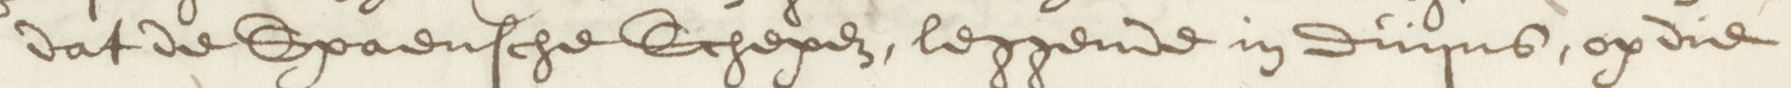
dat de Spaensche Schepen, leggende in Duijns, op die
